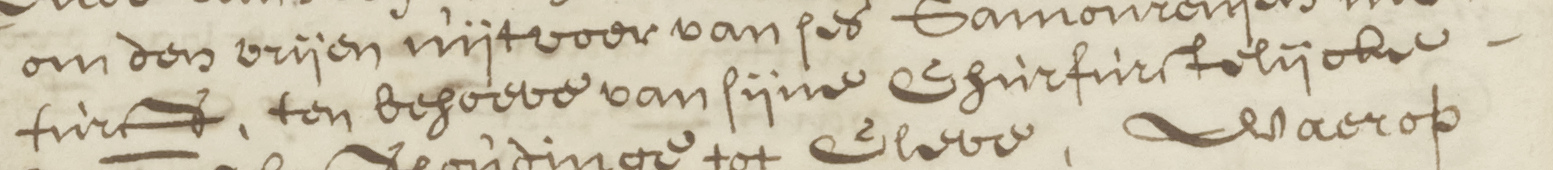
turff, ten behoeve van sijne Churfurstelijcke -
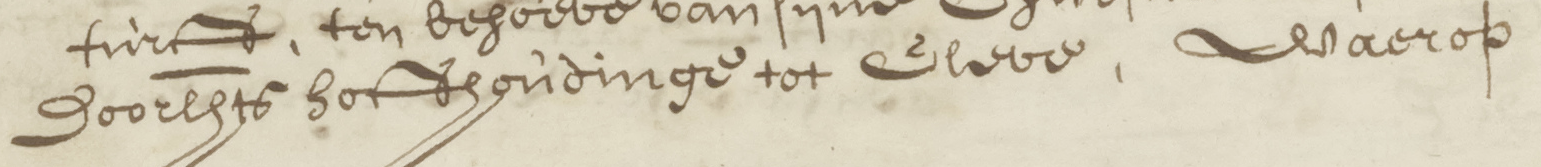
Doorlhts hoffhoudinge tot Cleve. Waerop
